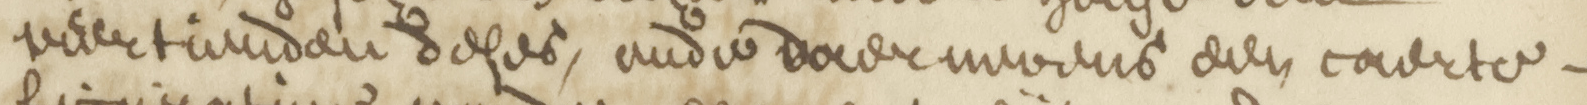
veertienden deses, ende daernevens een caerte
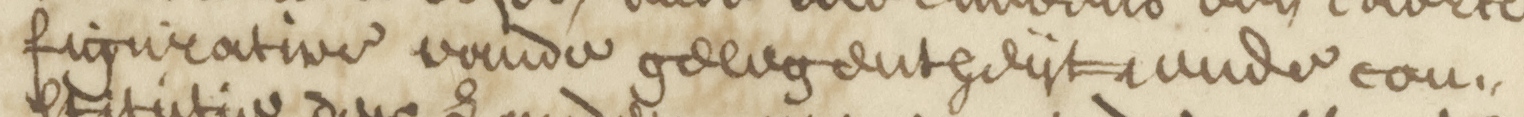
figurative vande gelegentheijt, ende con„
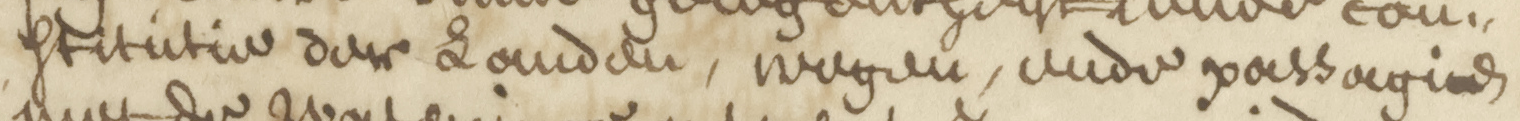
„stitutie der Landen, wegen, ende passagien
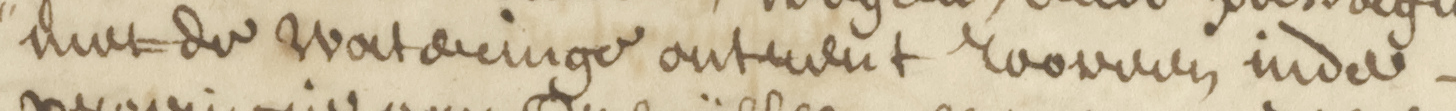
met de wateringe ontrent Rooveen inde —
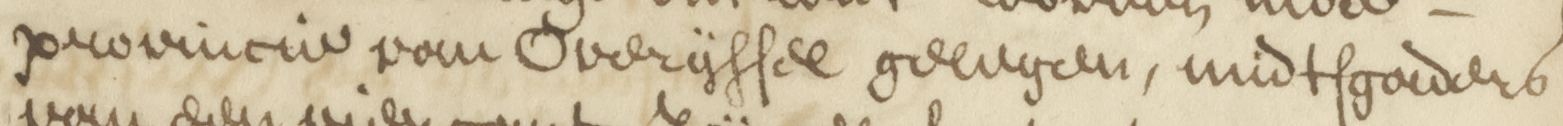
provincie van Overijssel gelegen, midtsgaders
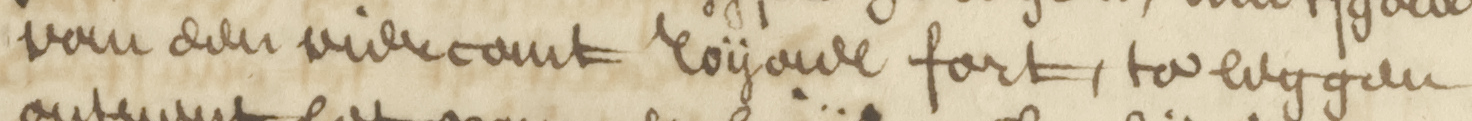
van een viercant Roijael fort, te leggen
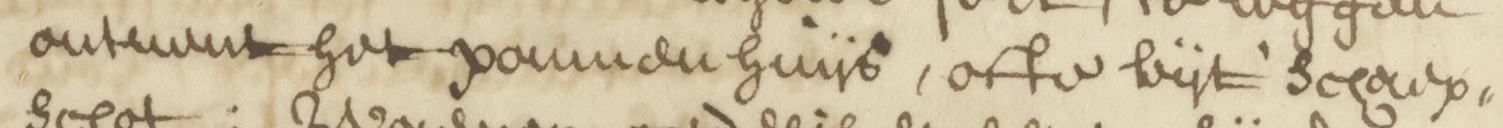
ontrent het pannenhuijs, ofte bijt‛ Schaep,,
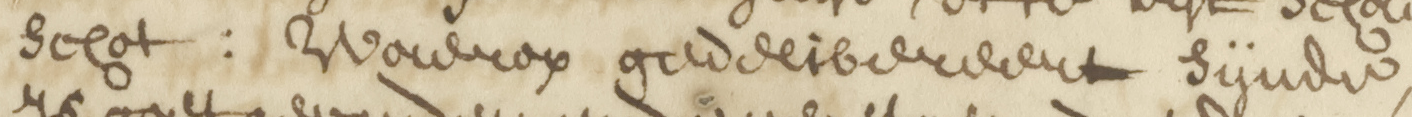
schot: Waerop gedelibereert sijnde,
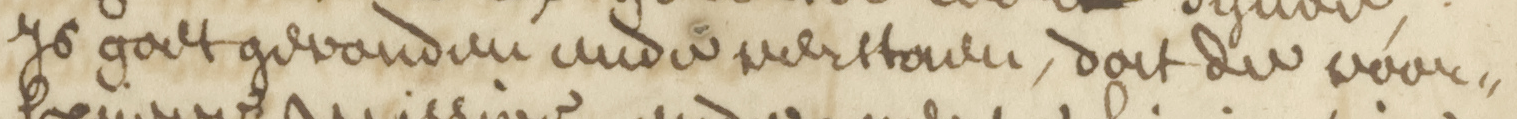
Is goetgevonden ende verstaen, dat de voor„
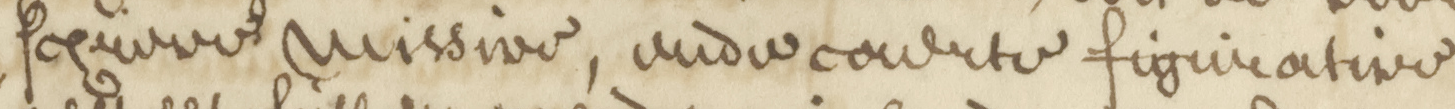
„schreve Missive, ende caerte figurative
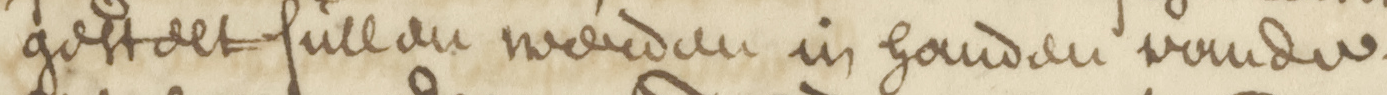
gestelt sullen werden in handen vande —
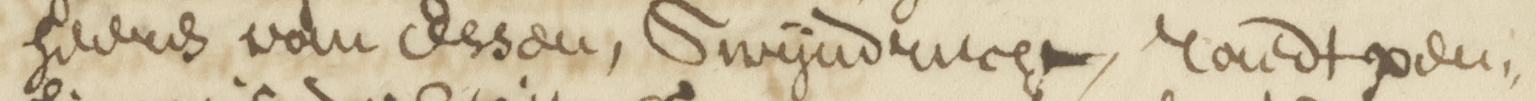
heeren van Essen, Swijndrecht, Raedtpen„,
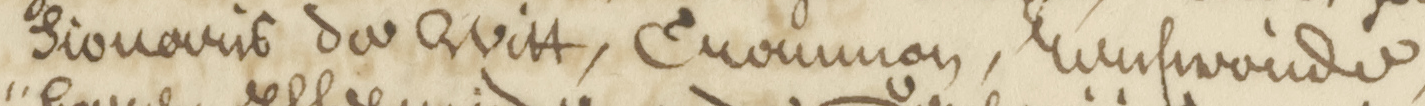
„sionaris de Witt, Crommon, Renswoude,
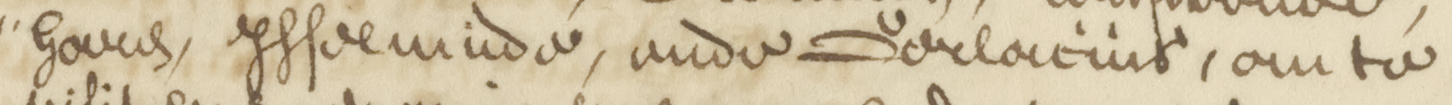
haren, Isselmude, ende Gerlacius, om te —
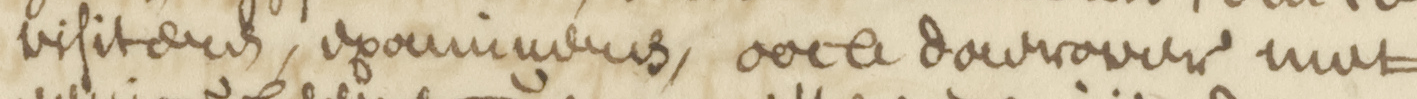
visiteren, examineren, oock daerover met
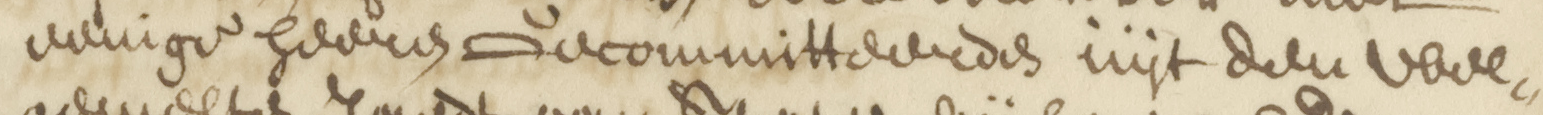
eenige heeren Gecommitteerden uijt den wel„
